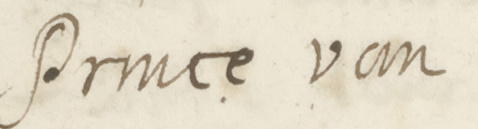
Prince van
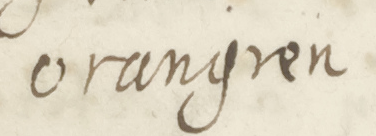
orangien
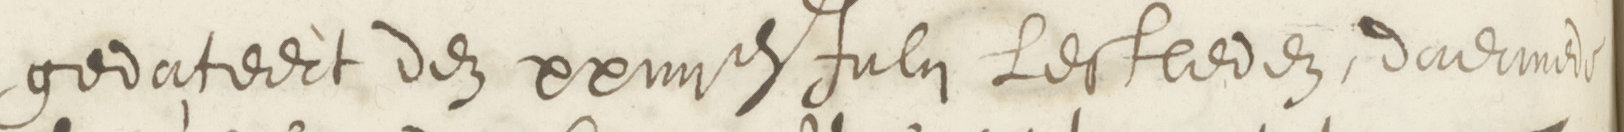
gedateert den xxxiiiien July lestleden, daermede
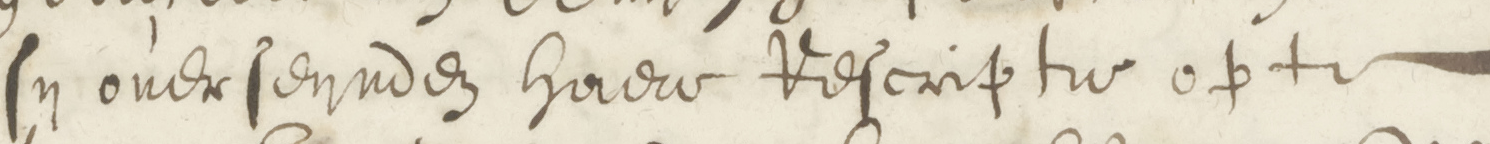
sy ouerseynden haere Rescriptie opte
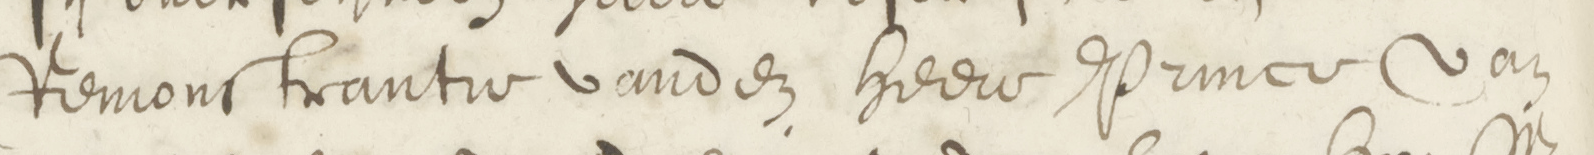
Remonstrantie vanden heere Prince van
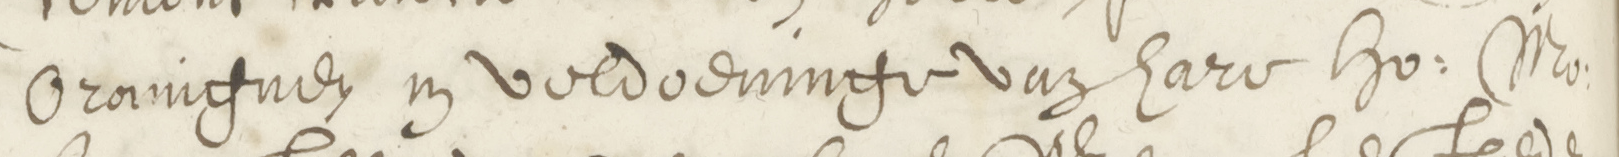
Oranignen in voldoeninge van hare Ho:Mo:
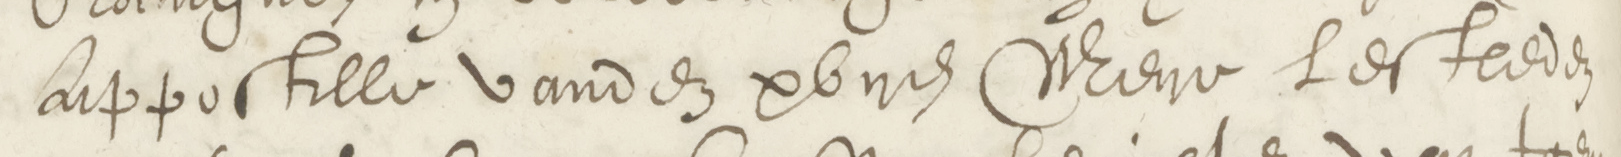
appostille vanden xviien Meye lestleden
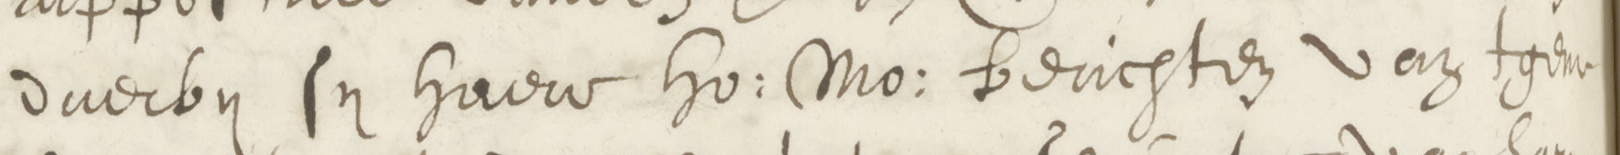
daerby sy haere ho:Mo: berichten van tgene
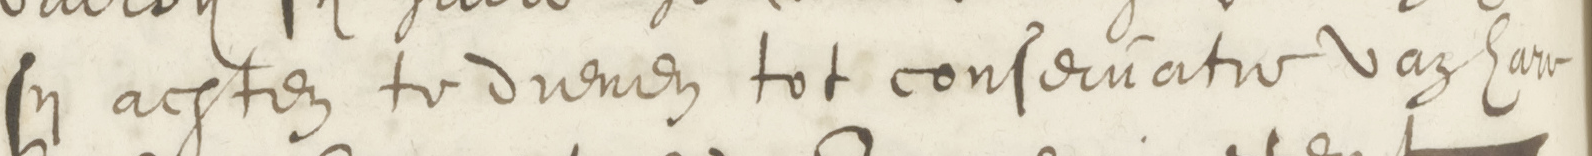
sy achten te dienen tot conseruatie van hare
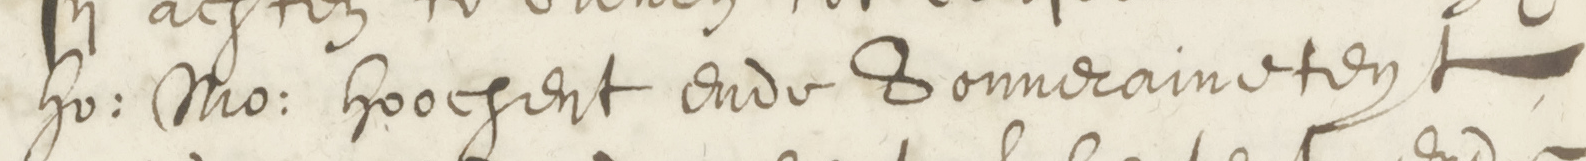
ho:Mo: hoocheyt ende Souueraineteyt
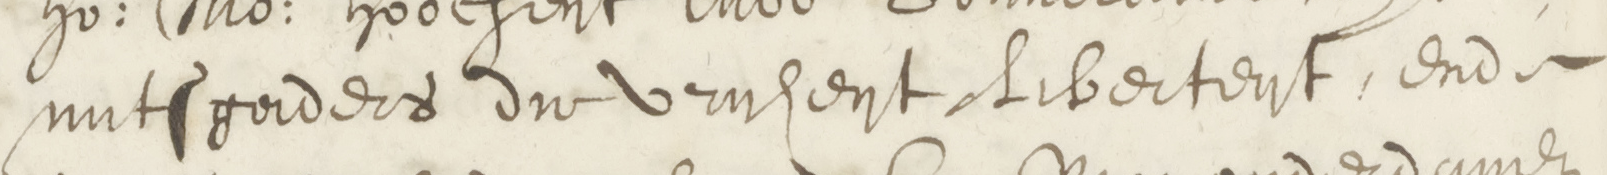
mitsgaders die vryheyt, liberteyt, ende
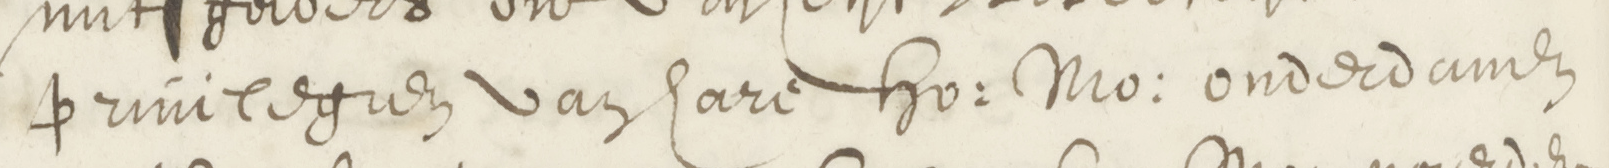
priuilegien van hare ho:Mo: onderdanen
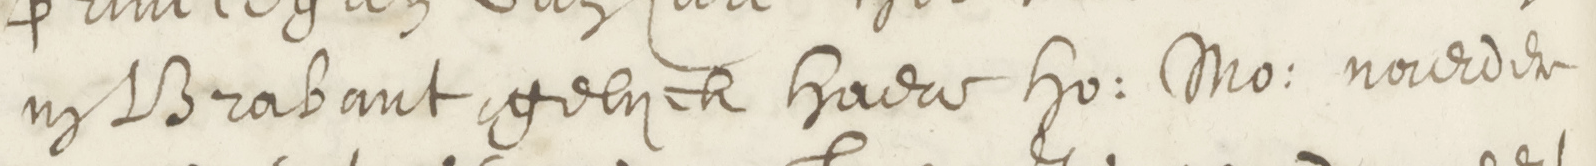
in Brabant gelyck haere ho:Mo: naerder
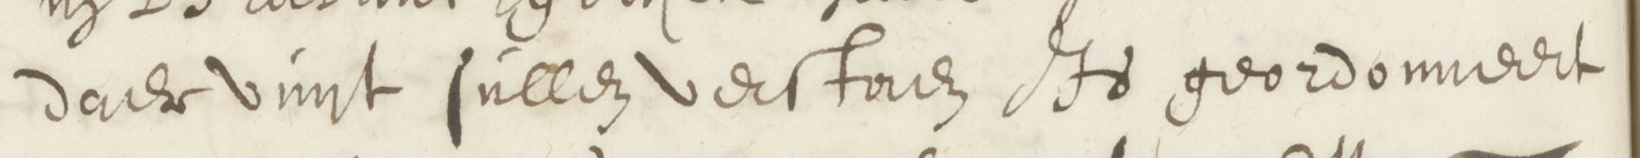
daer vuyt sullen verstaen Is geordonneert
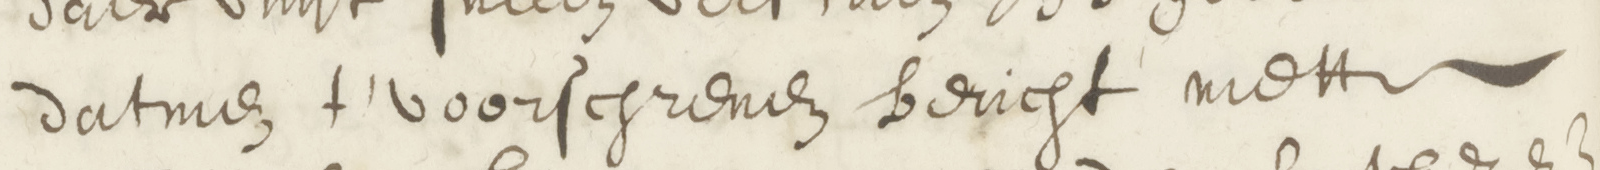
datmen t‛voorschreuen bericht mette
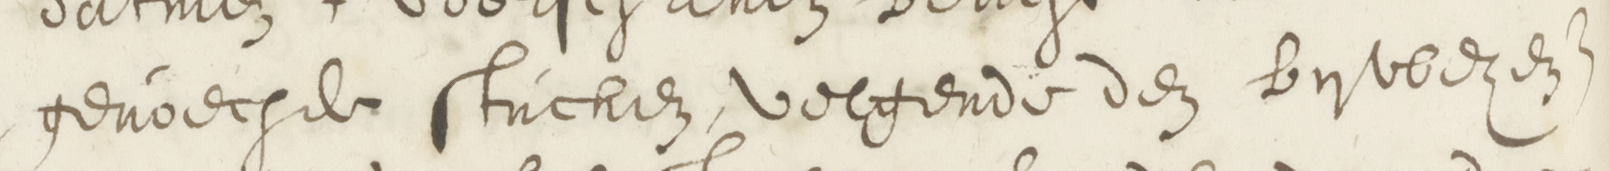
geuoechde stucken, volgende den bywezen
